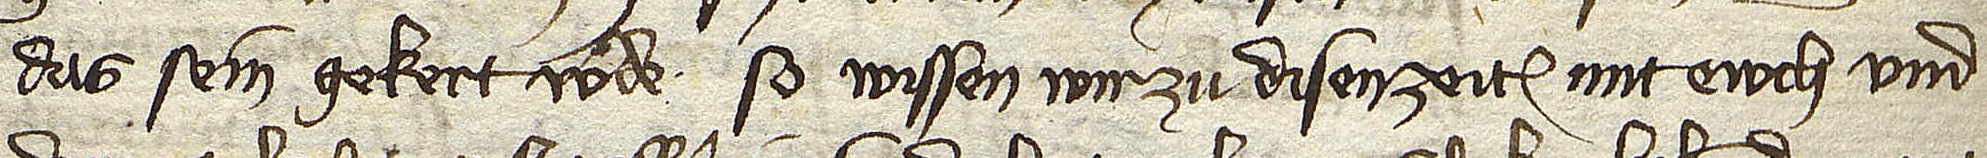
das ſein gekert w*de . ſo wiſſen wir ʒu diſenʒeit* mit ewch vnd
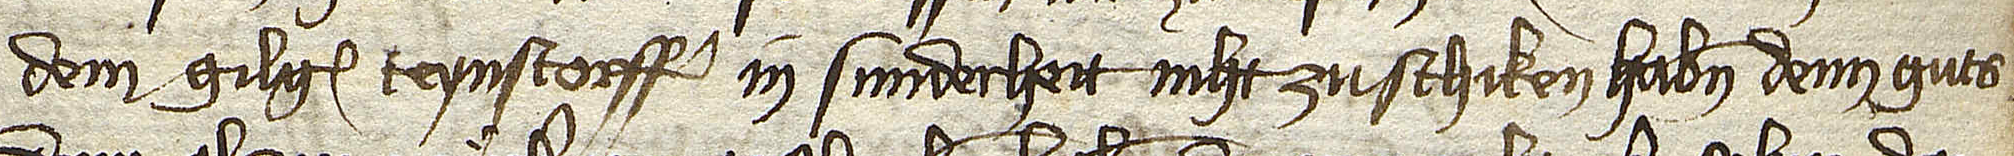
dem gilg* teynſtorff* in ſunderheit niht ʒu ſchiken habn* denn guts
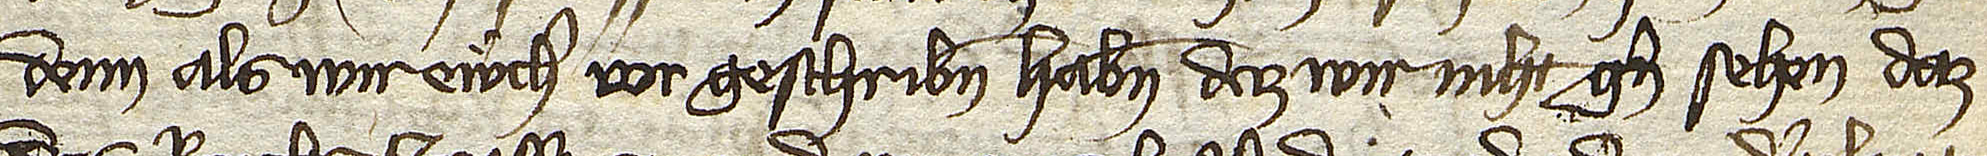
denn als wir eẅch vor geſchribn* habn* daʒ wir niht g*n ſehen daʒ
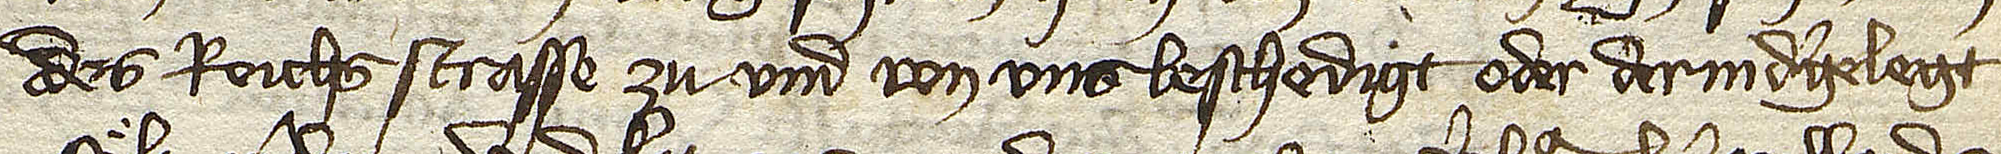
des Reichs ſtraſſe ʒu vnd von vns beſchedigt oder dernid*gelegt
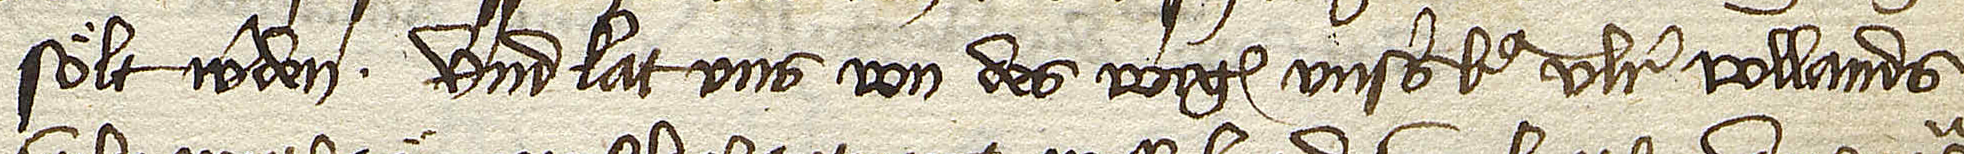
ſölt w*den . Vnd lat vns von des vorg* vnſ*s b* vlr* vollands
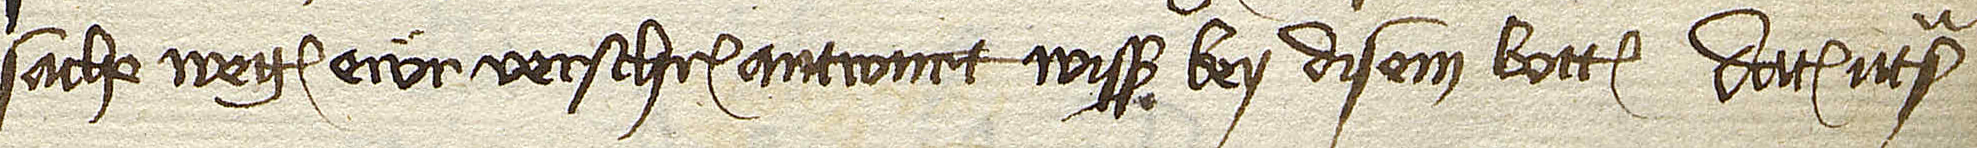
ſache weg* eẅr verſchr* antwurt wiſſ* bey diſem bott* Dat* ut ſ*
